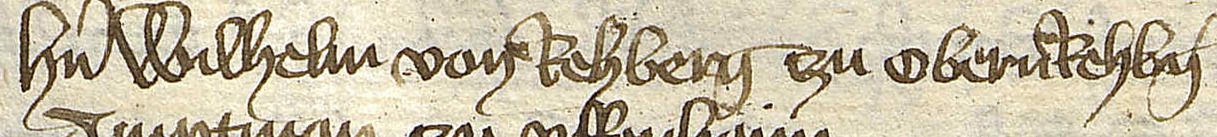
hn* Wilhelm von Rehberg cʒu OberRehbg*
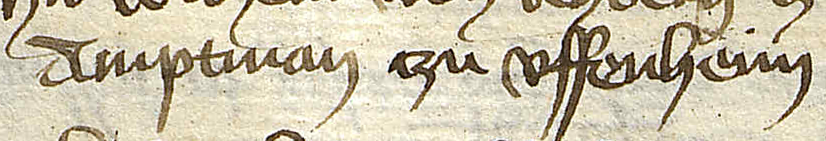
Amptman cʒu vffenheim
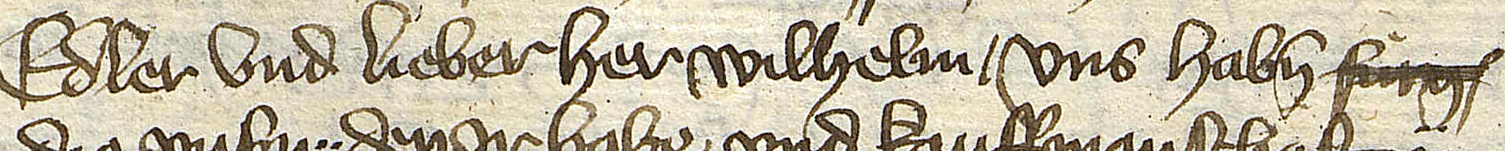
Edler vnd lieber her wilhelm / vns habn* fürg*
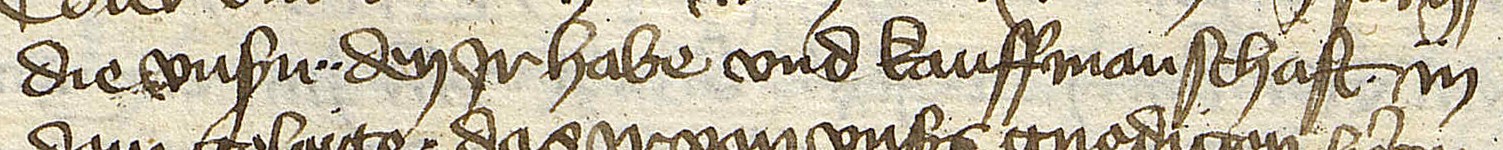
die vnſ*n ~ den Ir habe vnd kauffmanſchaft in
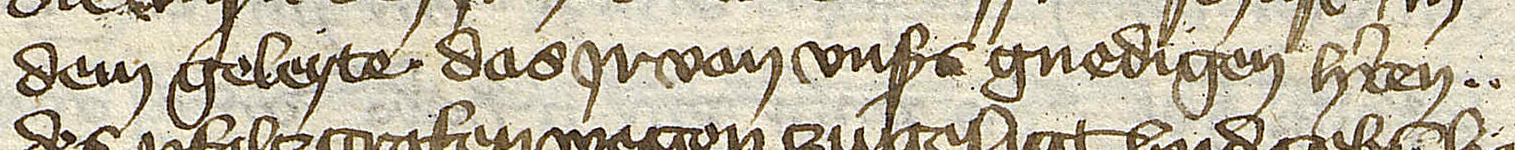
dem geleyte . das Ir von vnſ*s gnedigen h*ren ~
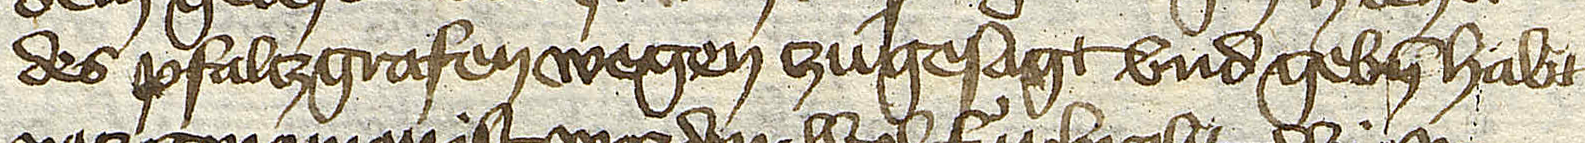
des pfalcʒgrafen wegen cʒugeſagt vnd gebn* habt
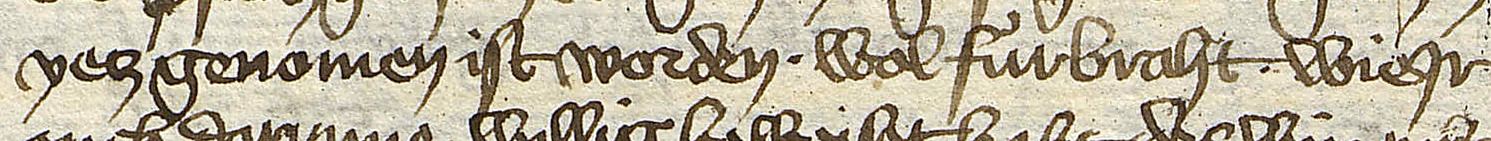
yecʒ genomen iſt worden . wol fürbraht . wie Ir
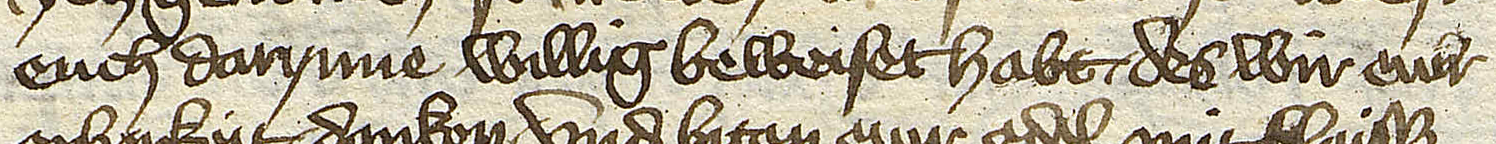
euch darynne willig beweiſet habt / des wir ew*r
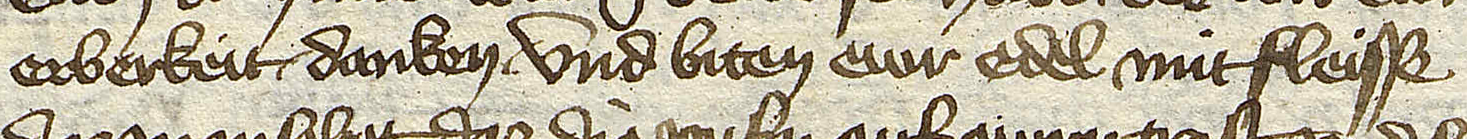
erberkeit / danken / Vnd biten ewr edel mit fleiſſe
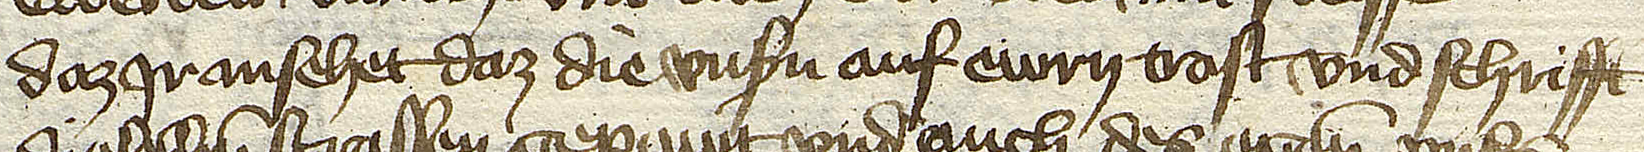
daʒ Ir anſehet daʒ die vnſ*n auf ewrn troſt vnd ſchrifft
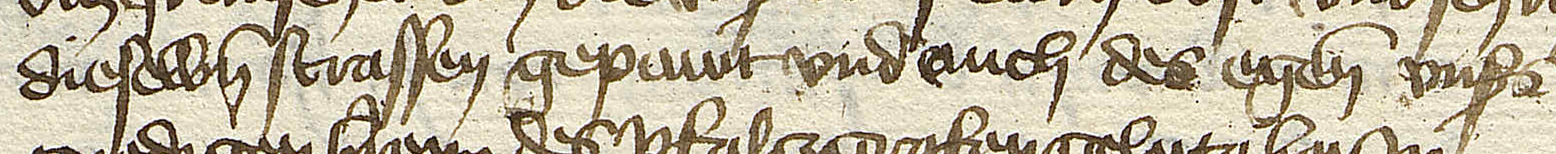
dieſelbn* ſtraſſen gepawt vnd auch des egen* vnſ*s
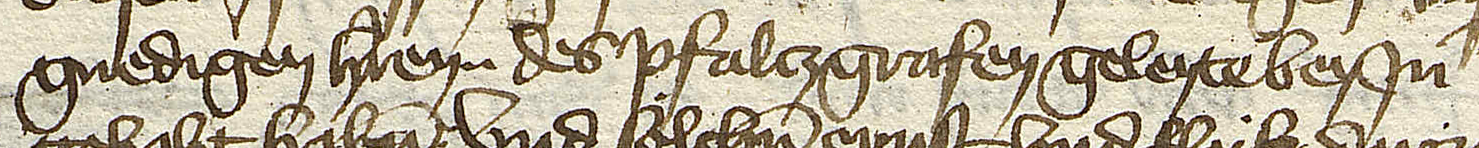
gnedigen h*ren ~ des Pfalcʒgrafen geleyte bey In
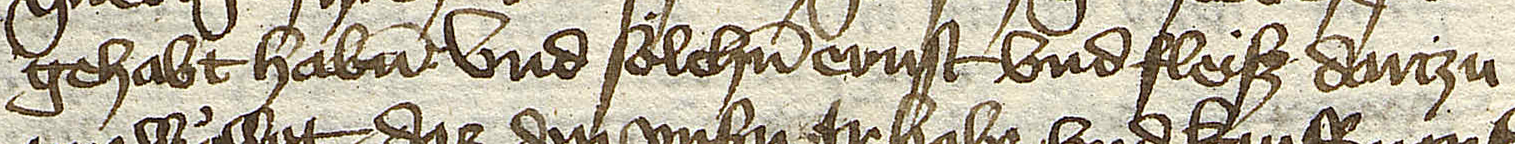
gehabt habn* . vnd ſolchn* ernſt vnd fleiſʒ darcʒu
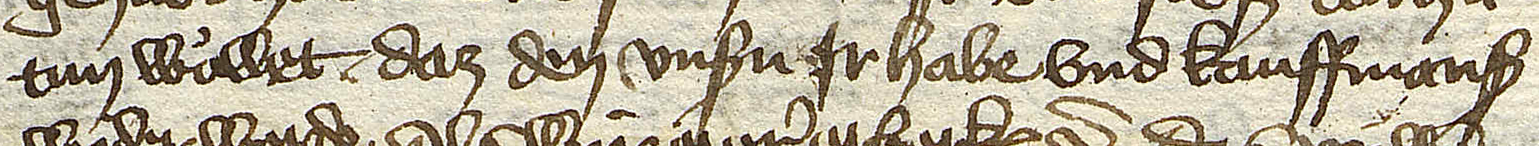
tun wöllet / daʒ den vnſ*n Ir habe vnd kauffmanſ*
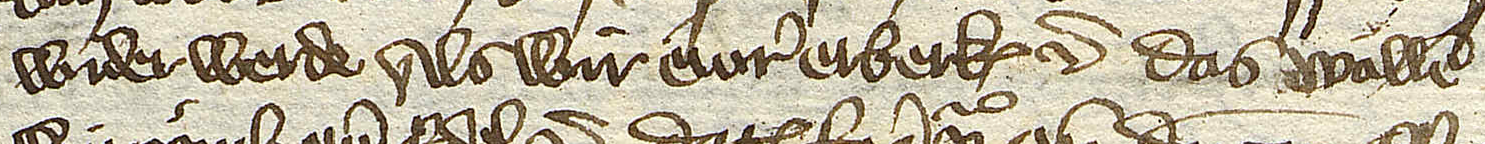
wider werde Als wir ewr* erberk* ec* das wölle*
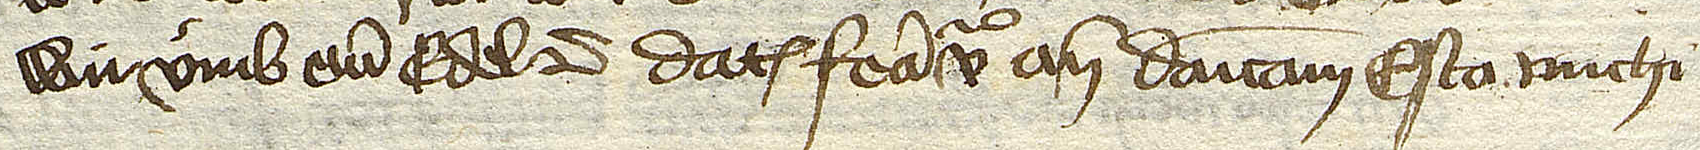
wir v̈mb ew* Edel ec* dat* fea* v* an* doicam* Eſto michi
